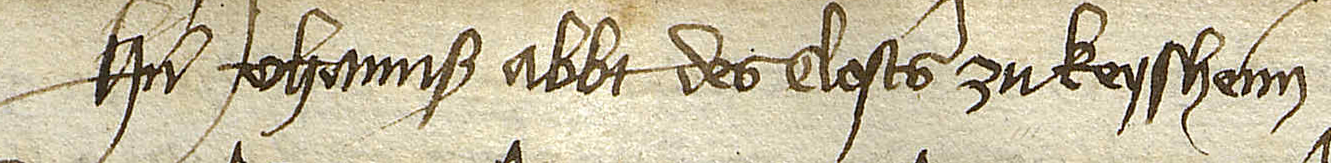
H*n Iohannſ* abbt des cloſt*s ʒu Keyſheim
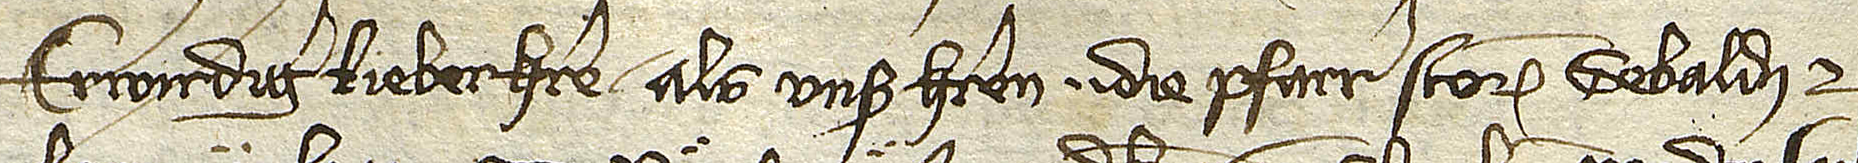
Erwirdig* lieber h*re / als vnſ* h*ren ~ die pfarr* ſco* Sebaldi @
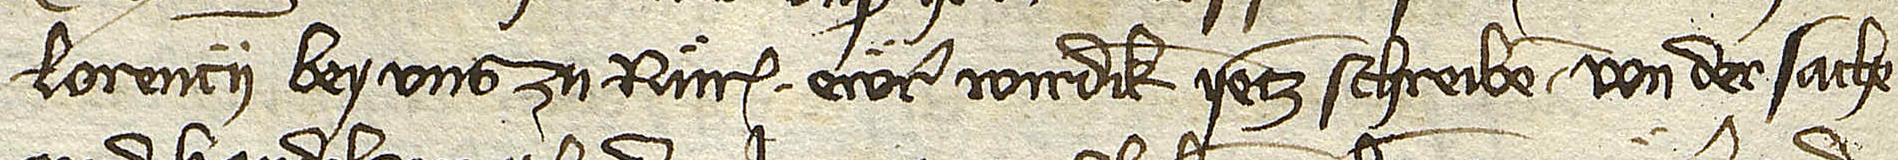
lorencii bey vns ʒu Nür* . ew*r wirdik* yecʒ* ſchreibe* / von der ſache
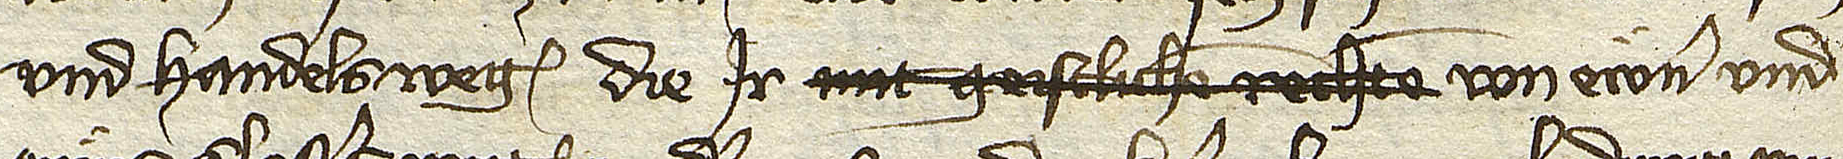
vnd handels weg* die Ir mit geiſtliche* rechte* von ew*n vnd
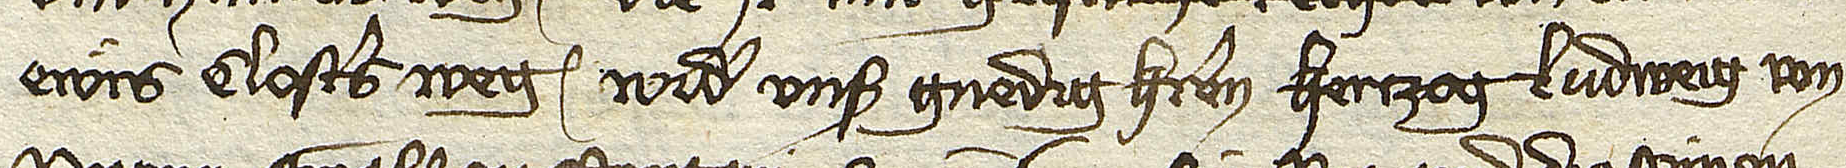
ewrs Cloſt*s weg* wid* vnſ* gnedig h*ren hercʒog ludweig von
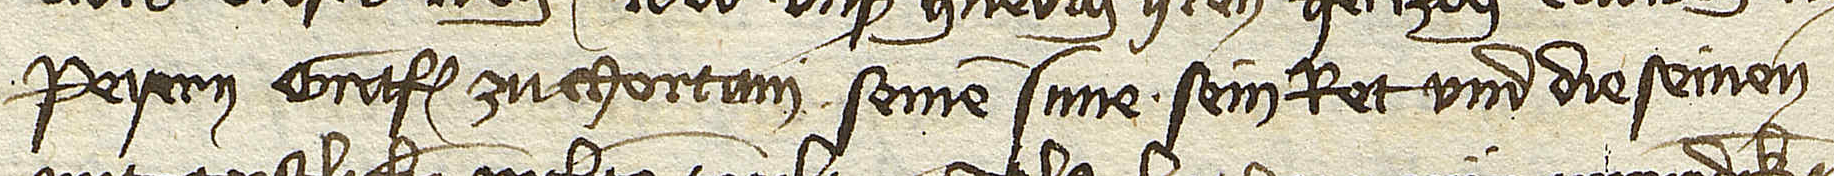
Peyern Graf* ʒu Mortani ſeine* ſune . ſein Ret vnd die ſeinen
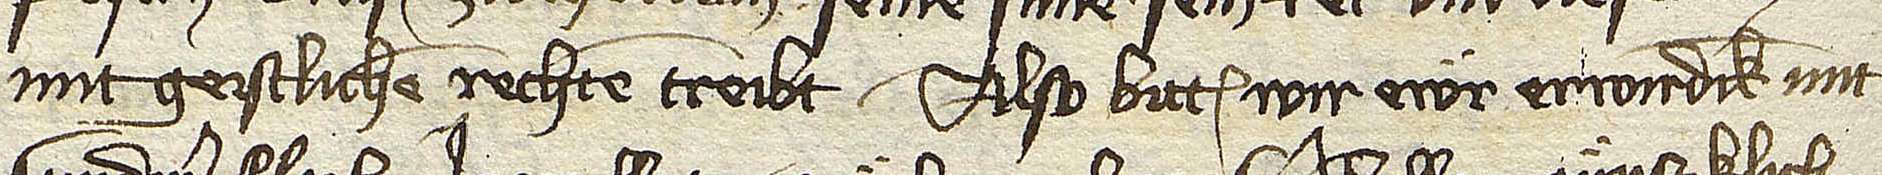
mit geiſtliche* rechte* treibt / Alſo bitt* wir ewr erwirdik* mit
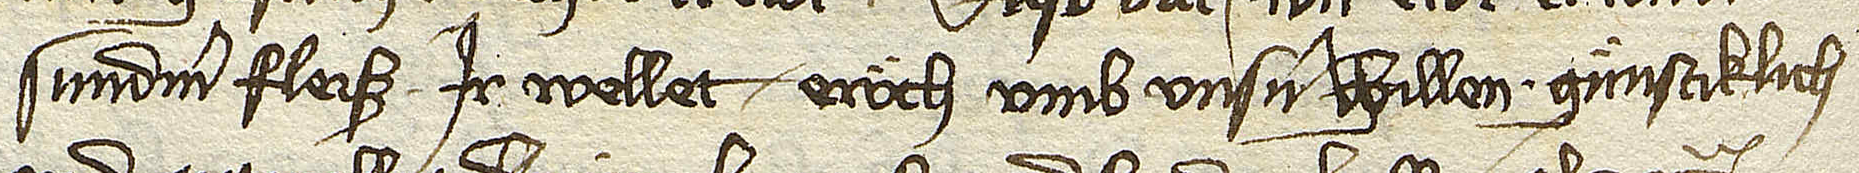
ſundm* fleiſʒ . Ir wellet / ewch vmb vnſ*n Willen . günſtiklich
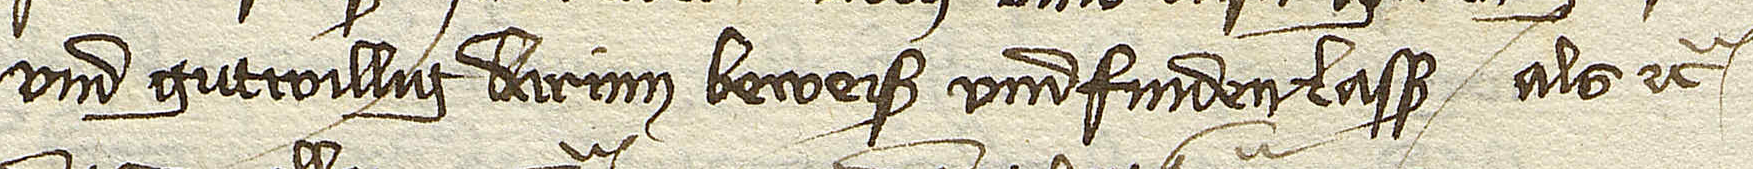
vnd gutwillig darinn beweiſ* vnd finden laſſ* / als ec*
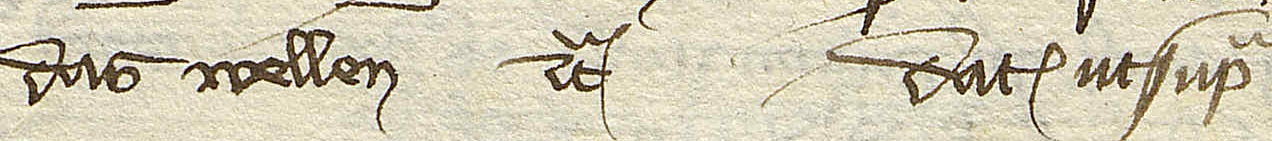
das wellen ec* / Dat* ut ſup*
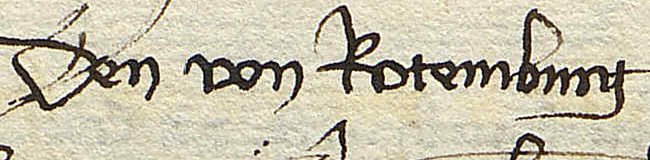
Den von Rotemburg
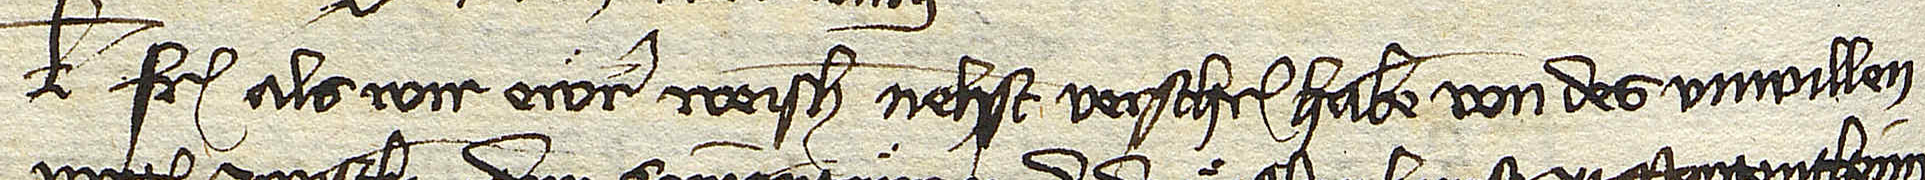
L* fr* als wir ew*r weiſh* nehſt verſchr* habe* von des vnwillen
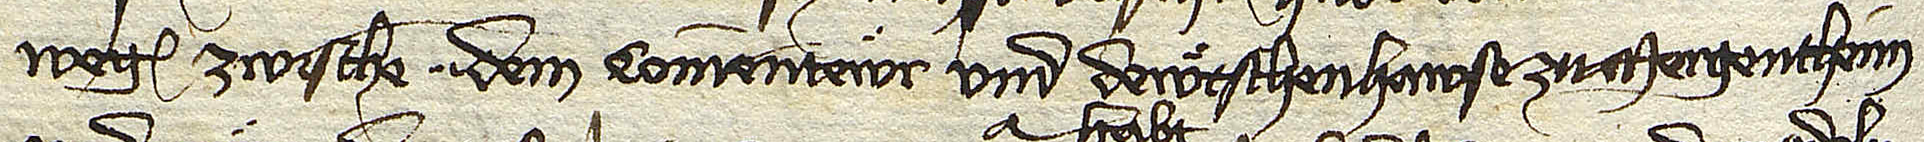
weg* ʒwiſche* ~ Dem Com*entewr vnd dewtſchen hawſe ʒu Mergentheim
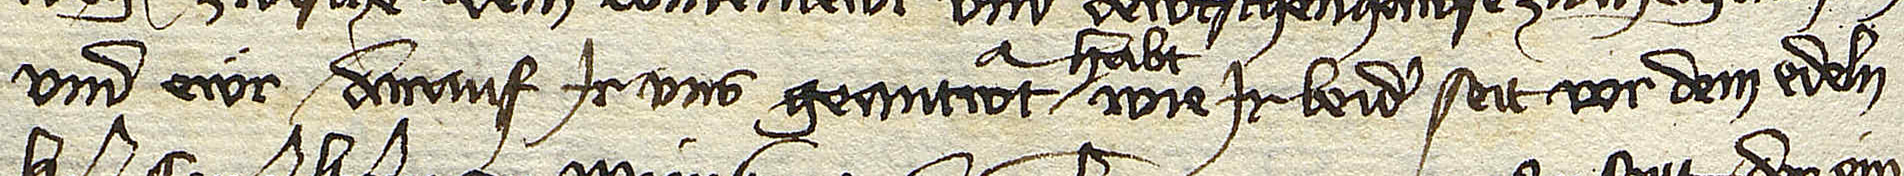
vnd ewr / darauf Ir vns geantw*t / wie Ir beid*ſeit vor dem edeln
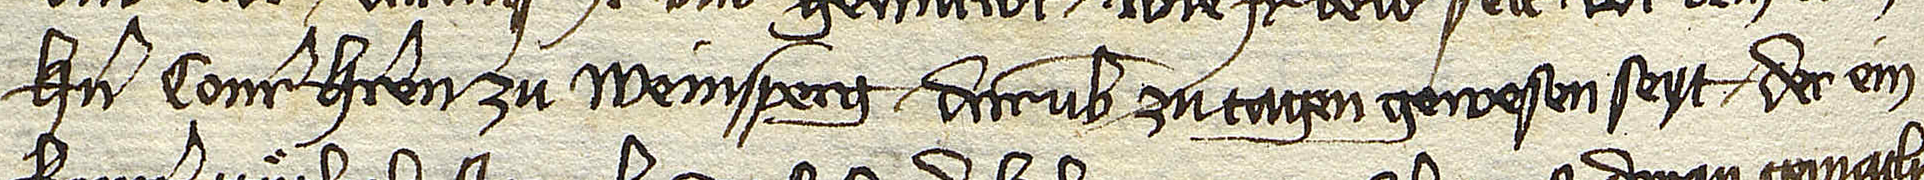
h*n Conr* h*ren ʒu Weinſperg / daru*b ʒu tagen geweſen ſeyt / der ein
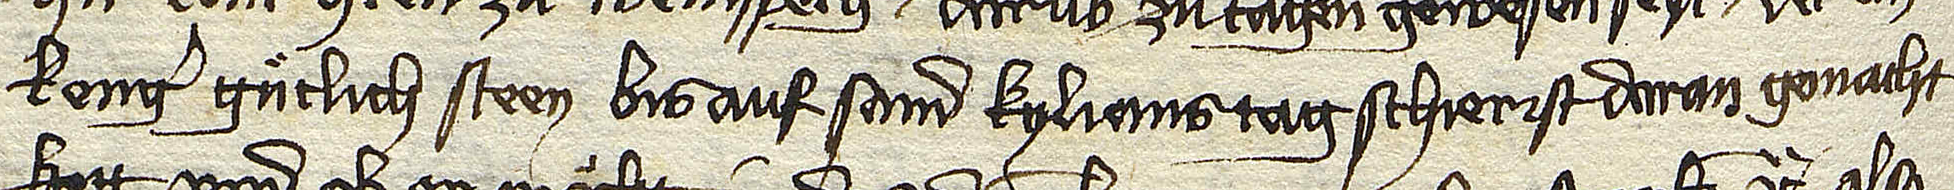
leng* gütlich ſteen bis auf ſand kylians tag ſchieriſt daran gemacht
